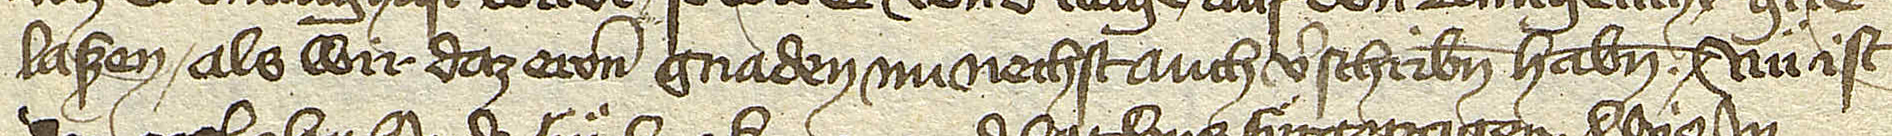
laſʒen / als wir daʒ ewn* gnaden nu nechſt auch v*ſchribn* habn* . / Nü iſt
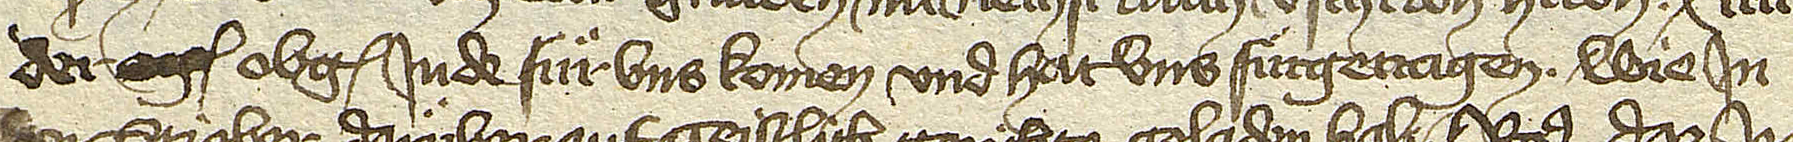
der eg* obg* Iude für vns komen vnd hat vns fürgetragen . / wie In
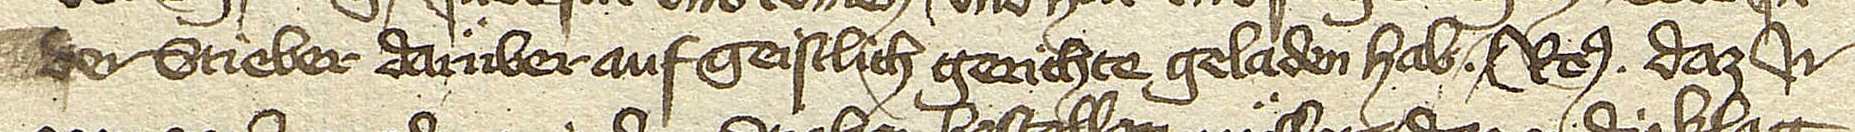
der Stieber darüber auf geiſtlich gerichte geladen hab . / Ro* . daʒ Ir
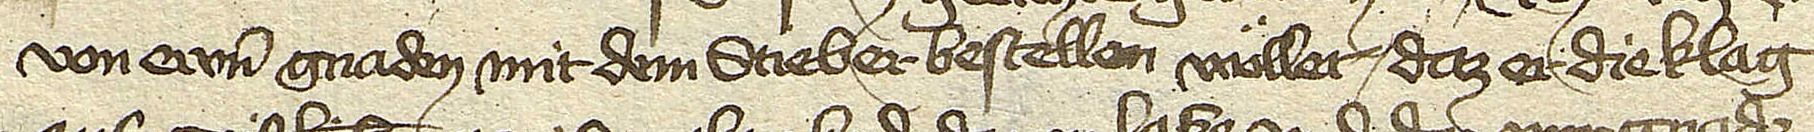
von ewn* gnaden mit dem Stieber beſtellen wöllet / daʒ er die klag
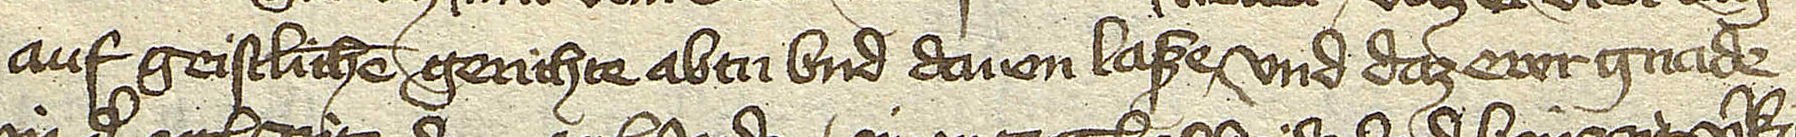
auf geiſtliche* gerichte abtu vnd dauon laſʒe / vnd daʒ ewr gnade
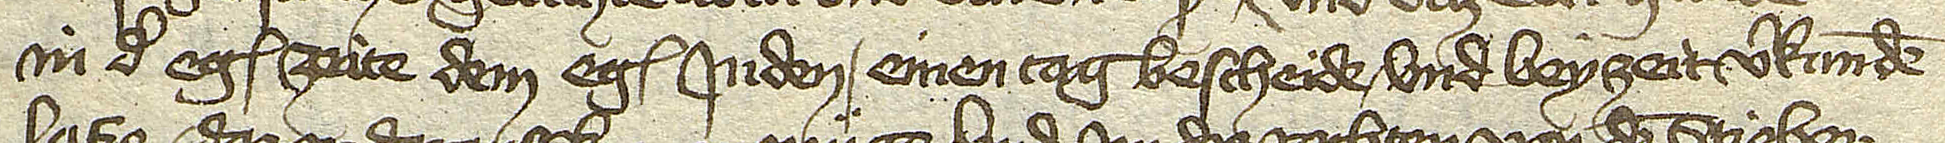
in d* eg* cʒeite dem eg* Iuden / einen tag beſcheide / vnd beycʒeit v*kunde*
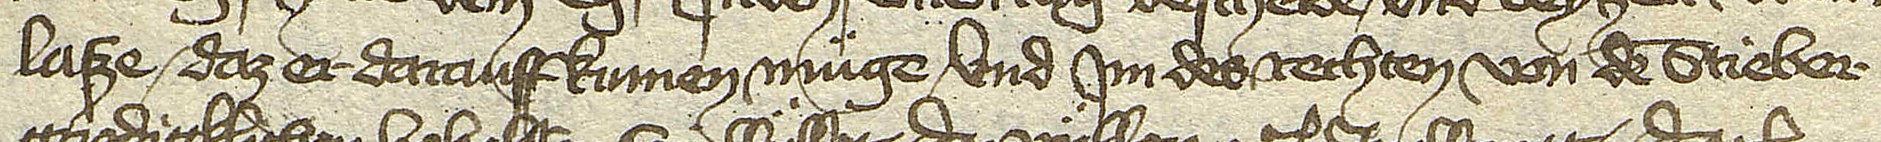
laſʒe / daʒ er darauff kumen müge / vnd Im des rechten von de* Stieber
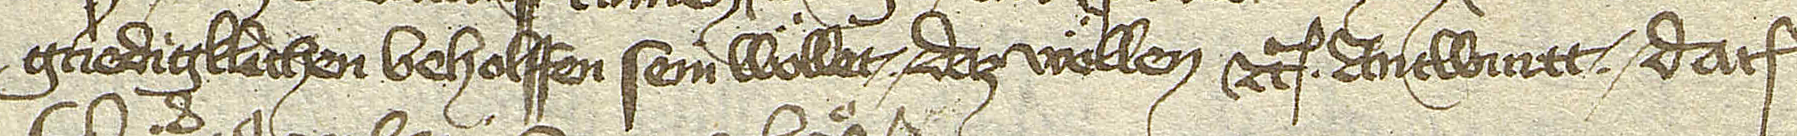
gnedigklichen beholffen ſein wöllet . / daʒ wöllen ec* . Antwurtt / . dat*
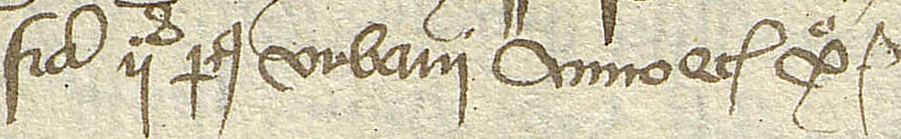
fia* ii* p* vrbani Anno ec* x* /
